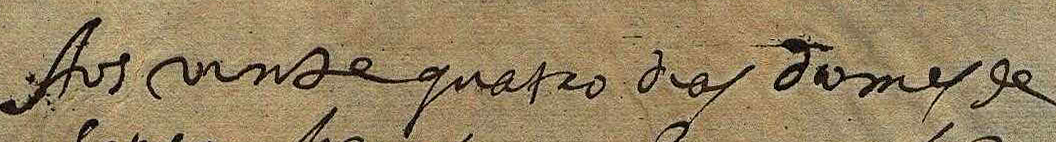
Aos vinte quatro dias do mes de
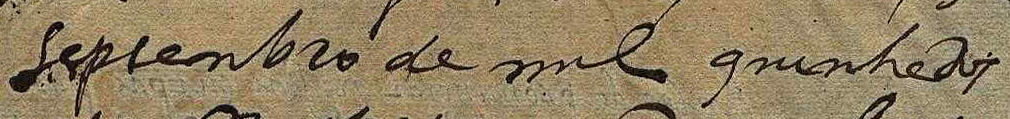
septenbro de mil quinhētos
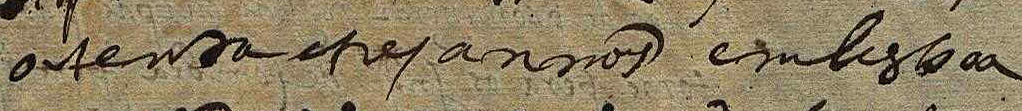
oitenta e tres annos̄ em lisboa
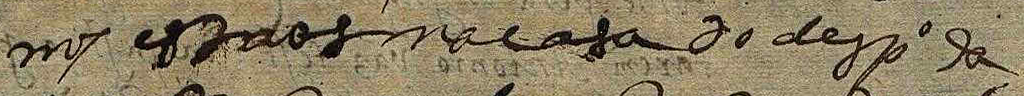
nos estaos na casa do despo da
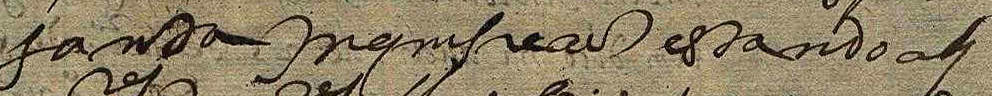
santa Jnquisicaõ estando ahj
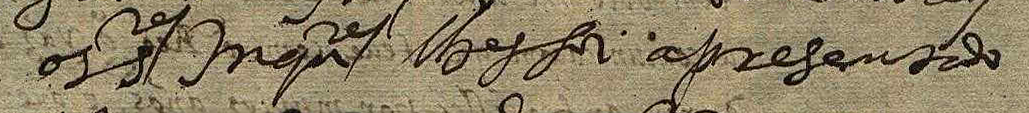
os sres Jnqures lhes foi apresentado
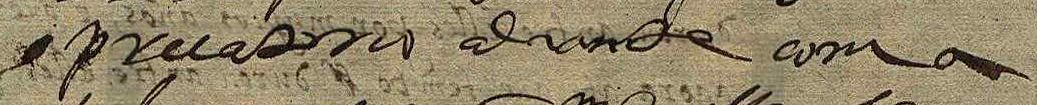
o precatorio adiante com a
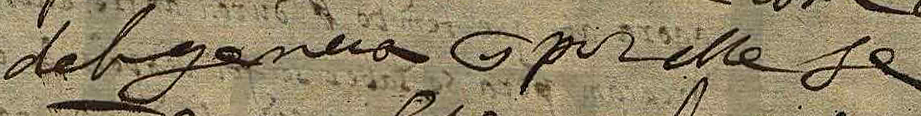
deligencia q̄ por elle se
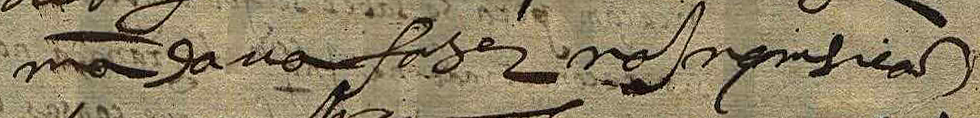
mādaua fazer na Jnquisiçaõ
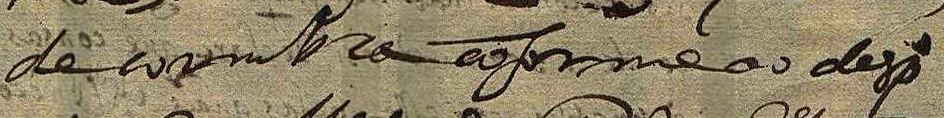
de coimbra cōforme ao despo
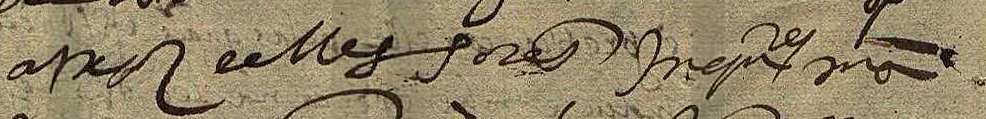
atraz e elles sores̄ Jnqures mā
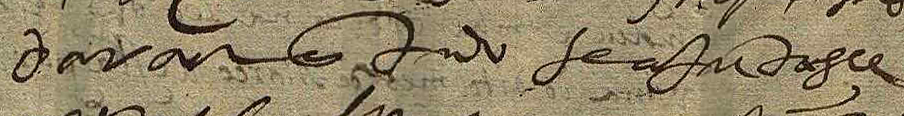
daram q̄ tudo se aJūtasse
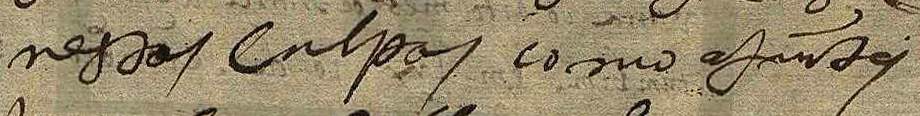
nestas Culpas como aJuntej
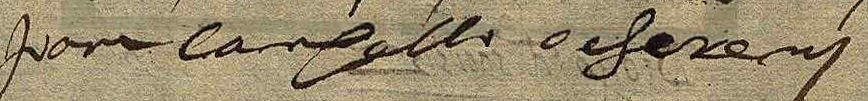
Joam canpello o escreuj
